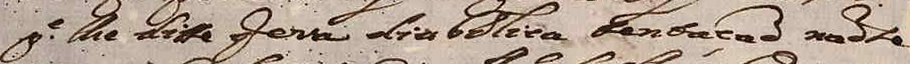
p.e lhe disse q̄ era diabolica tentaçaõ naõ se
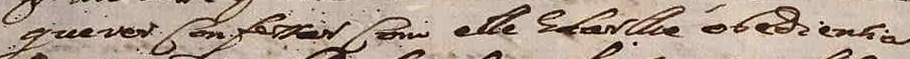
querer Confessar Com elle E darlhe obediencia
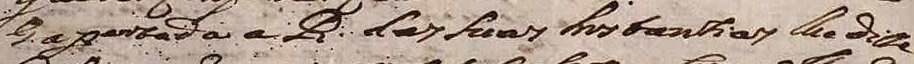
E apartada a R. das suas Instansias lhe disse
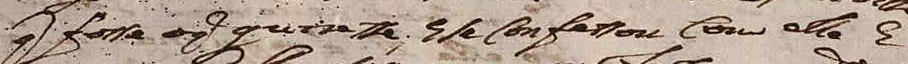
q̄ fosse o q̄ quizesse; E se Confessou com elle E
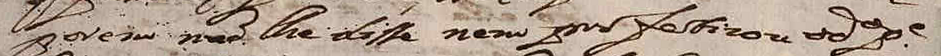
porem naõ lhe disse nem profetizou o do p.e
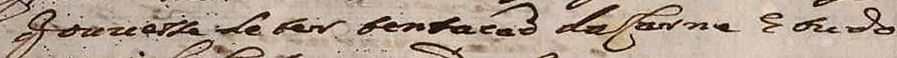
q̄ ouuesse de ter tentaçaõ da Carne E tudo
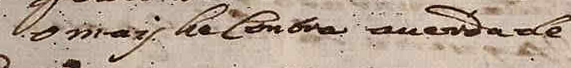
o mais he Contra a uerdade
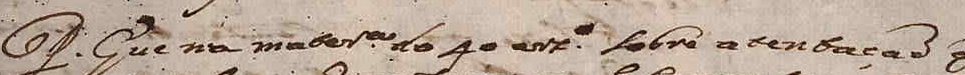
P. Que na mater.a do 4o art.o sobre a tentaçaõ q̄
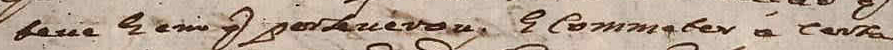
teue E em q̄ perseuerou; E commeter a certa
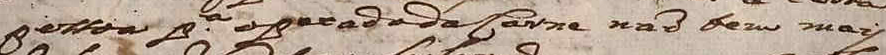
pessoa p.a o pecado da Carne naõ tem mais
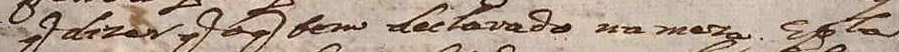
q̄ dizer q̄ o q̄ tem declarado na meza, E p̄la
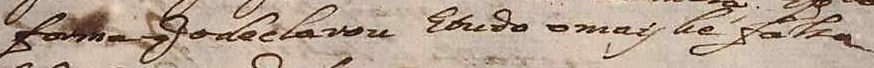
forma q̄ o declarou E tudo o mais he falso
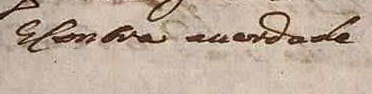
E Contra a uerdade.
